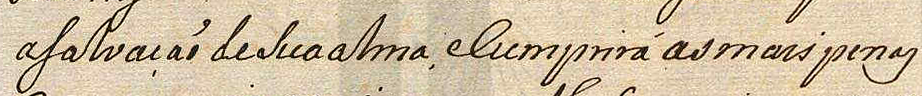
a salvaçaõ de sua alma, e Cumprirá as mais penas
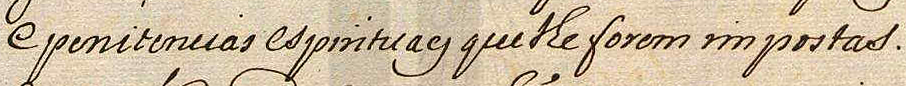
e penitencias espirituaes que lhe forem impostas.
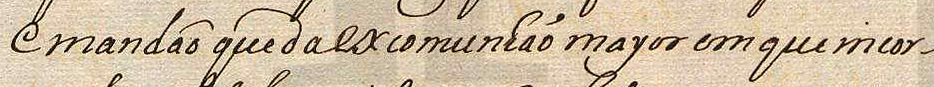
e mandão que da excomunhaõ mayor em que incor
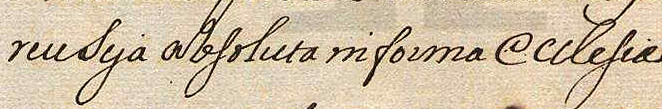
reu Seja absoluta in forma ecclesiæ
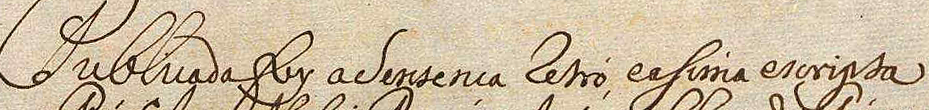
Publicada foy a Sentença Retro, e asima escripta
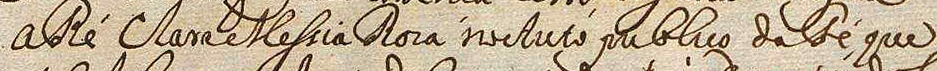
a Ré Clara Messia Roza no Auto publico da Fé, que
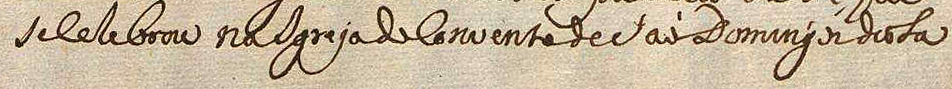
se Celebrou na Igreja do Convento de Saõ Domingoz desta
